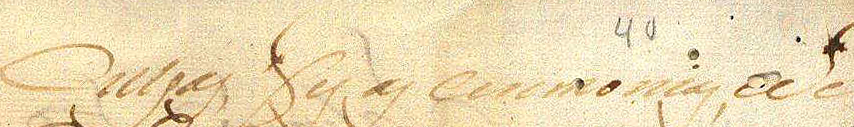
culpas, fes as ceremonias e se
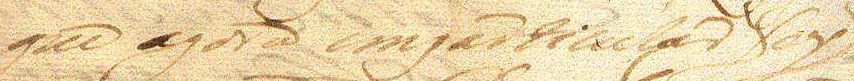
que agora em particular foy
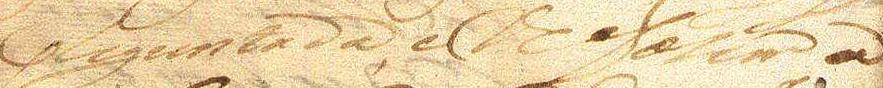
preguntada, e lhe fosem a
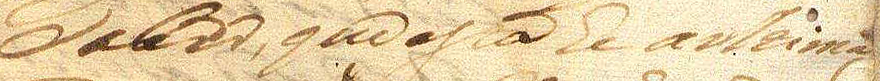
saber, que esta he a ultima
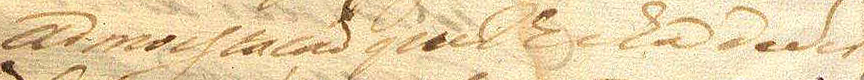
admoestaçaõ que lhe ha de ser
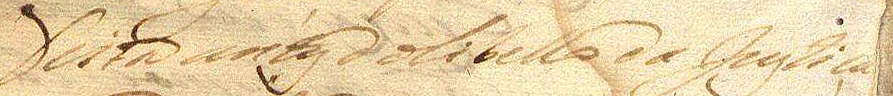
feita antes do libello da Justiça
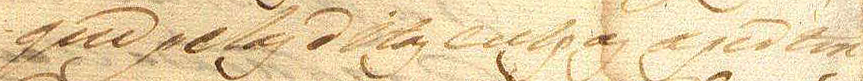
que pelas ditas culpas a perten
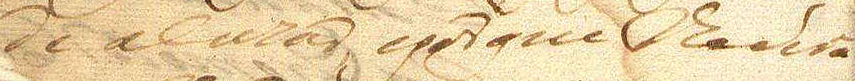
de acuzar, e porque lhe serâ
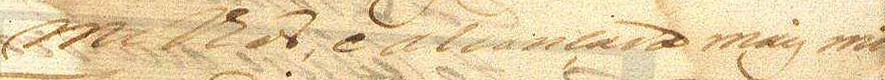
milhor, e alcançara mais mi
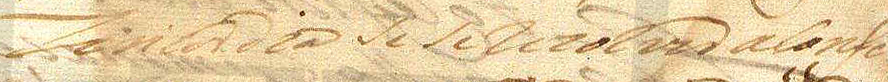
Ziricordia se se rezolver a confe
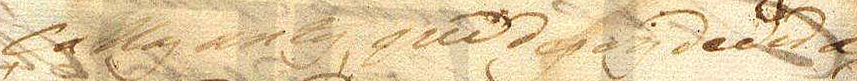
çallas antes, que depois de ser a
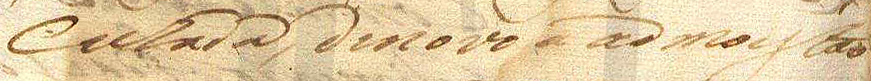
cuzada, de novo a admoestão
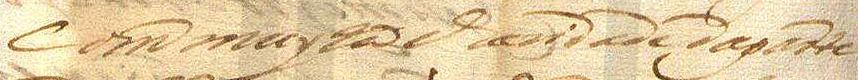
com muyta charidade da parte
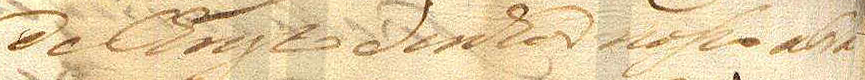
de Christo Senhor nosso abra
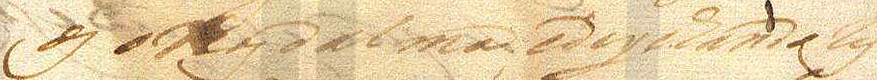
os olhos dalma e deychando res
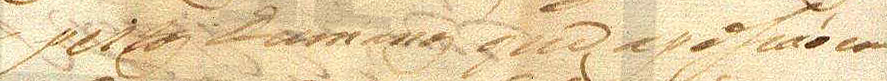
peitos humanos que a possaõ en
